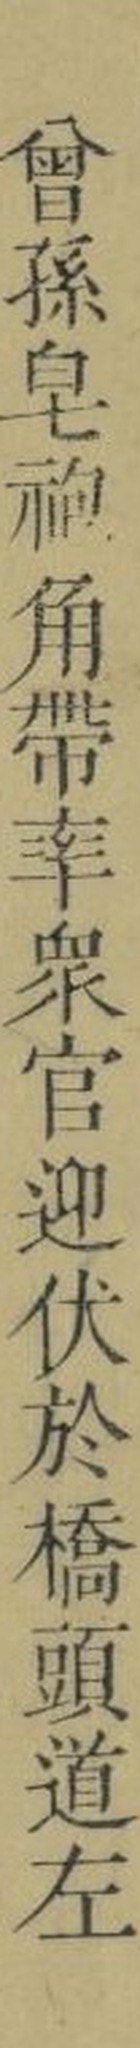曾孫皂袍角帶率衆官迎伏於橋頭道左
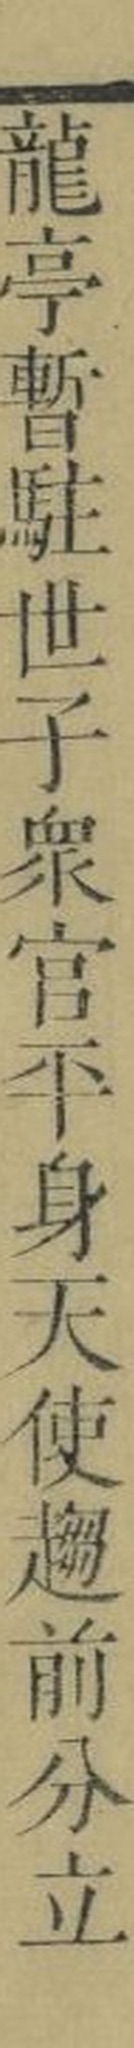龍亭暫駐世子衆官平身天使趨前分立
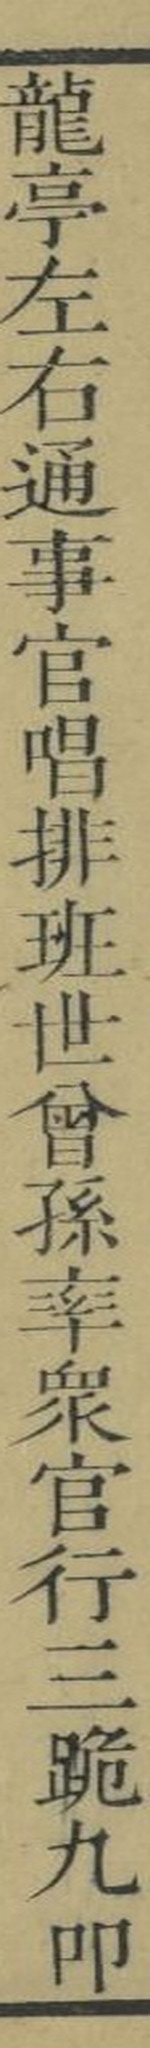龍亭左右通事官唱排班世曾孫率衆官行三跪九叩
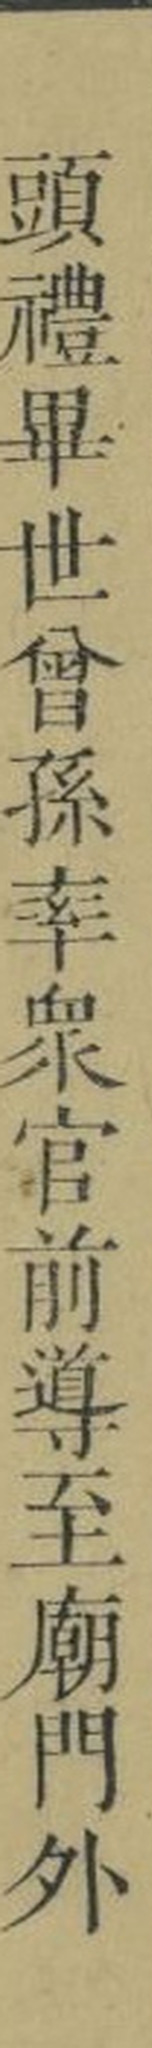頭禮畢世曾孫率衆官前導至廟門外
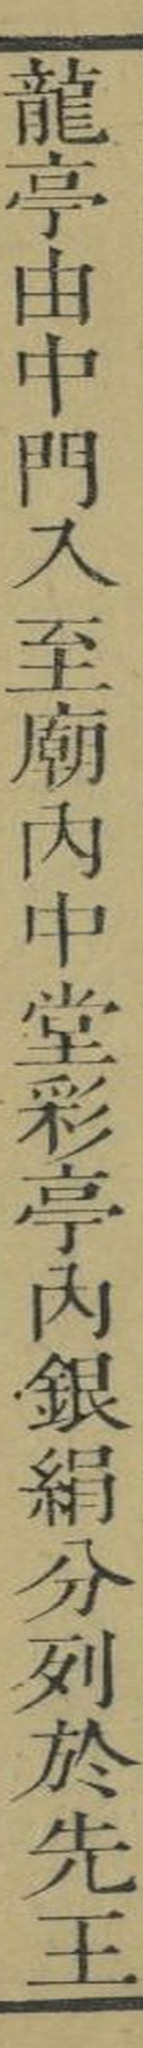龍亭由中門入至廟内中堂彩亭内銀絹分列於先王
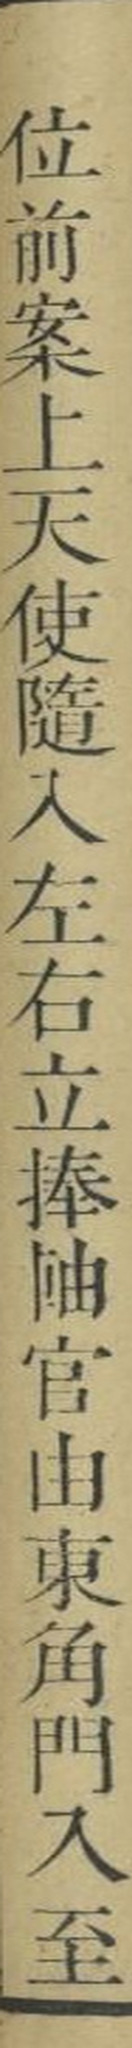位前案上天使隨入左右立捧軸官由東角門入至
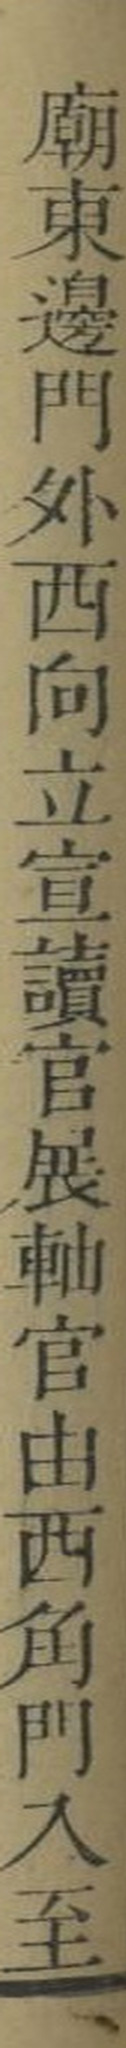廟東邊門外西向立宣讀官展軸官由西角門入至
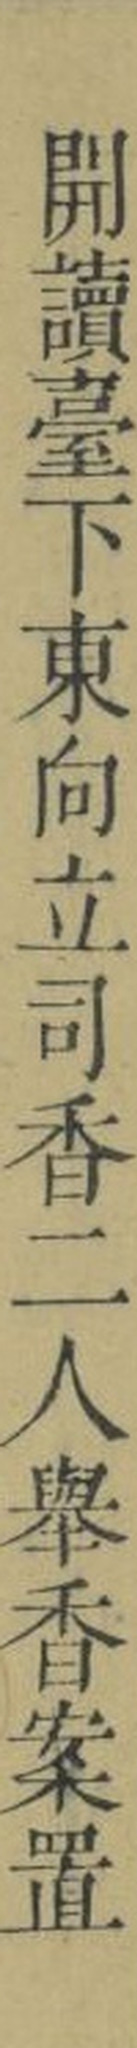開讀臺下東向立司香二人舉香案置
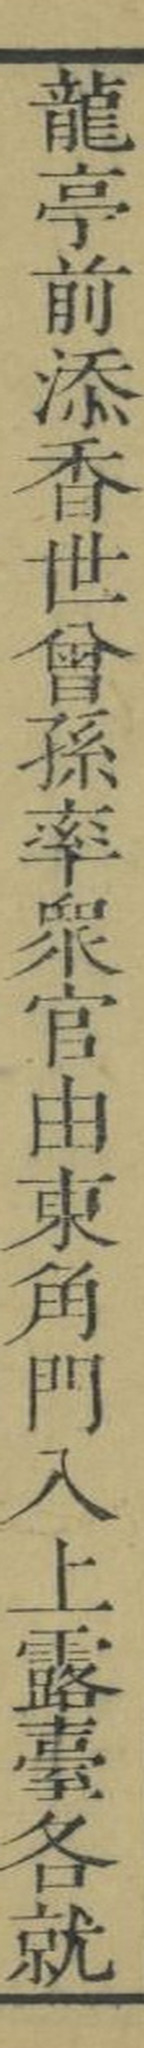龍亭前添香世曾孫率衆官由東角門入上露臺各就
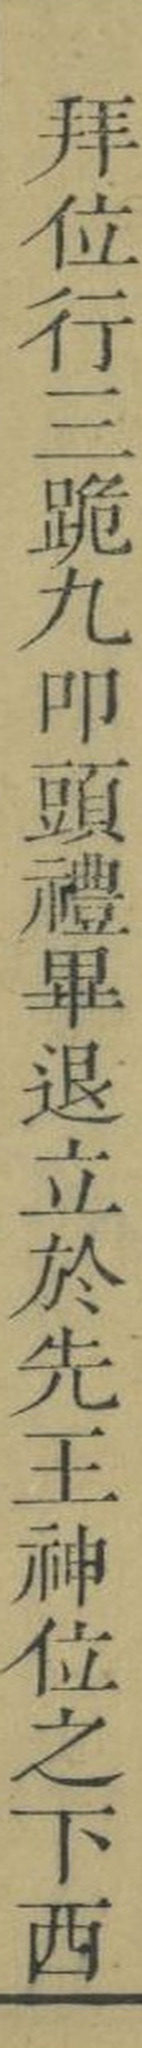拜位行三跪九叩頭禮畢退立於先王神位之下西
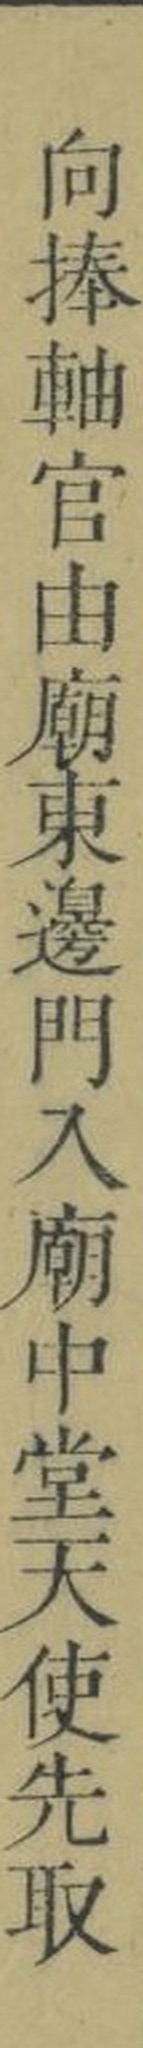向捧軸官由廟東邊門入廟中堂天使先取
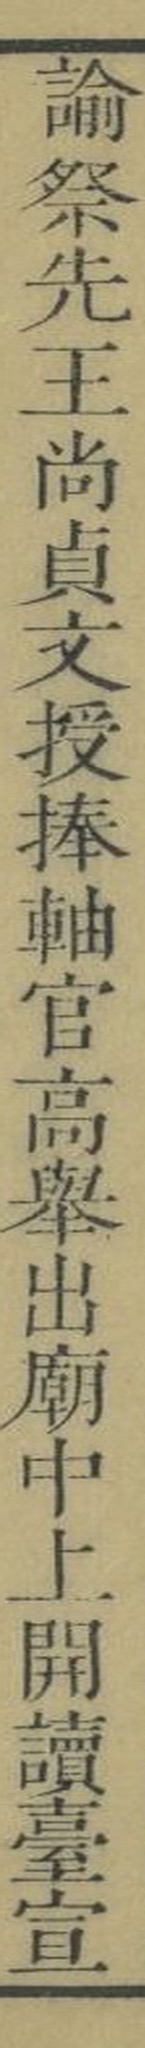諭祭先王尚貞文授捧軸官高舉出廟中上開讀臺宣
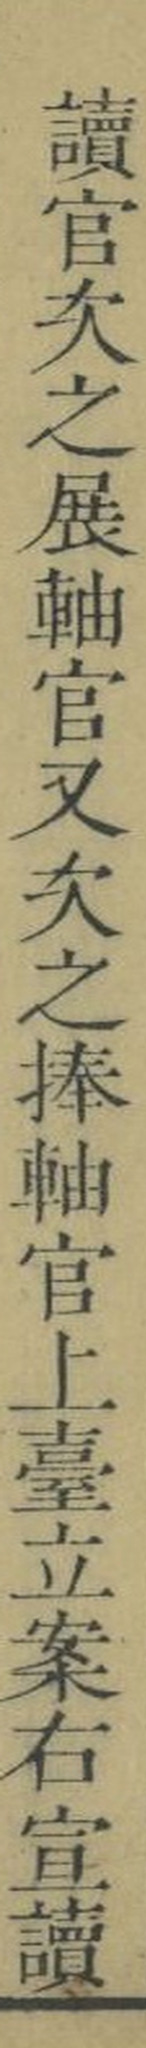讀官次之展軸官又次之捧軸官上臺立案右宣讀
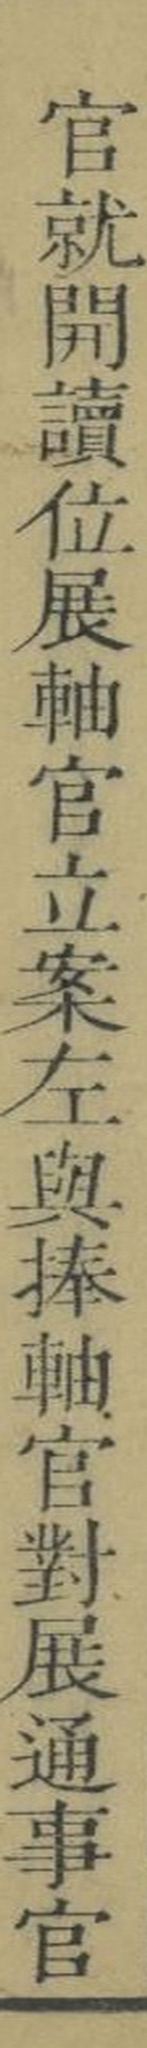官就開讀位展軸官立案左與捧軸官對展通事官
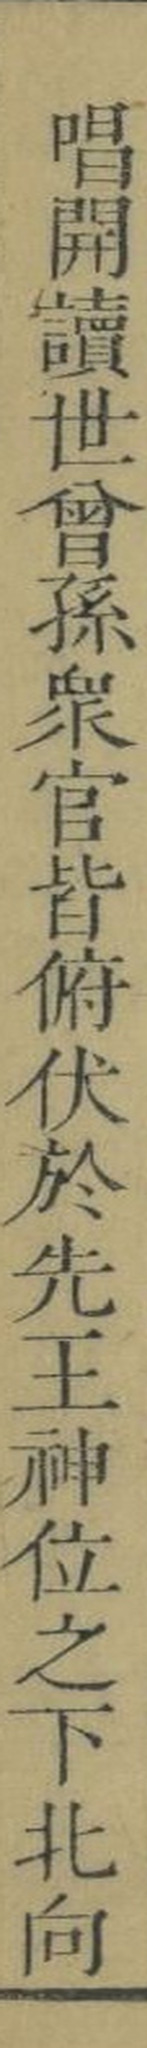唱開讀世曾孫衆官皆俯伏於先王神位之下北向

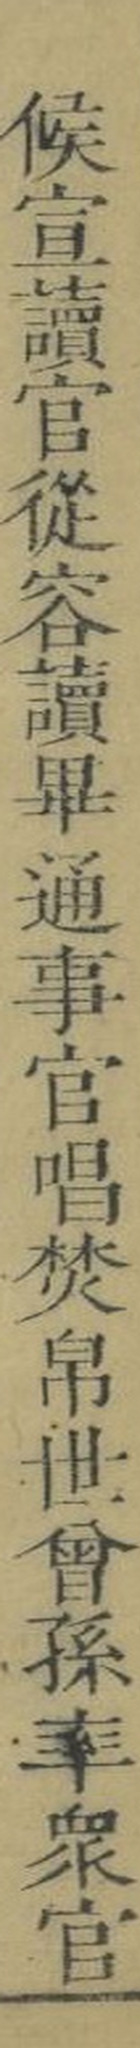候宣讀官從容讀畢通事官唱焚帛世曾孫率衆官
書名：中山伝信録 巻二
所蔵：University of the Ryukyus Library
